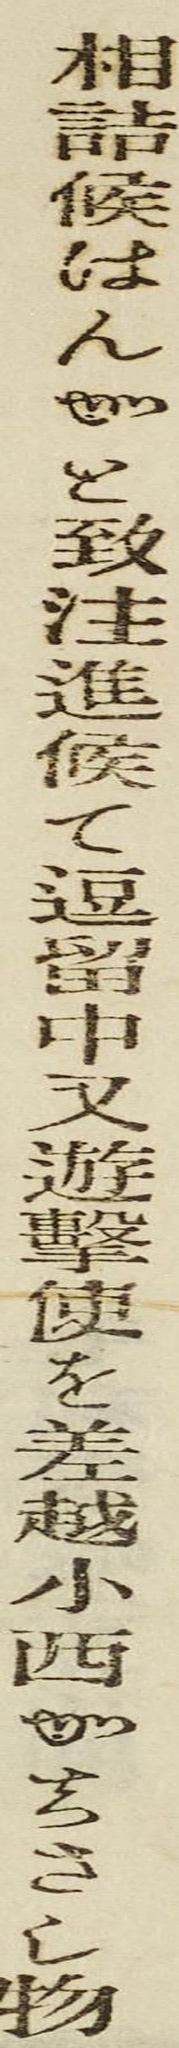相詰候はんかと致注進候て逗留中又遊撃使を差越小西かちさし物
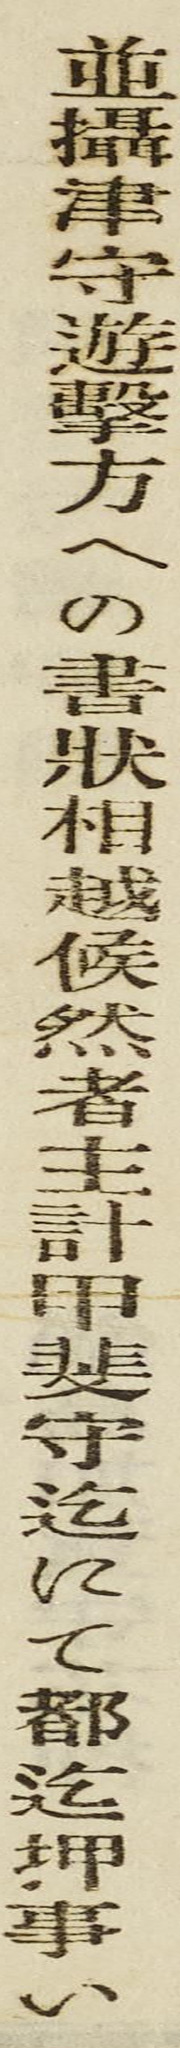並摂津守遊撃方への書状相越候然者主計甲斐守迄にて都迄押事い
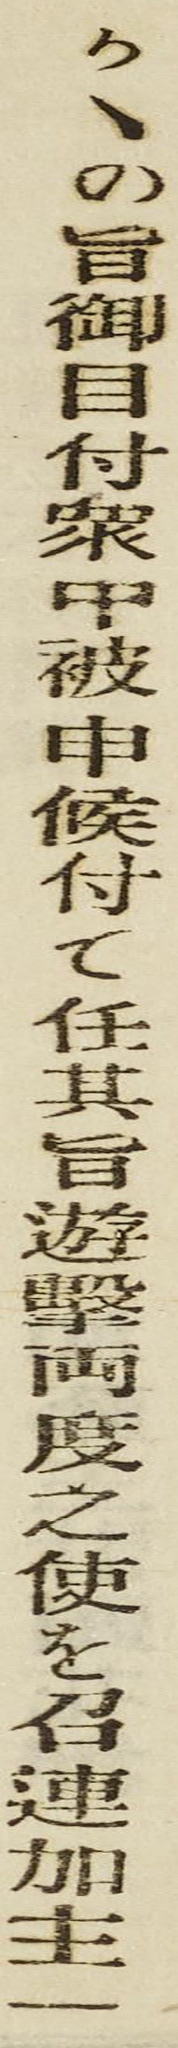かゝの旨御目付衆中被申候付て任其旨遊撃両度之使を召連可主一
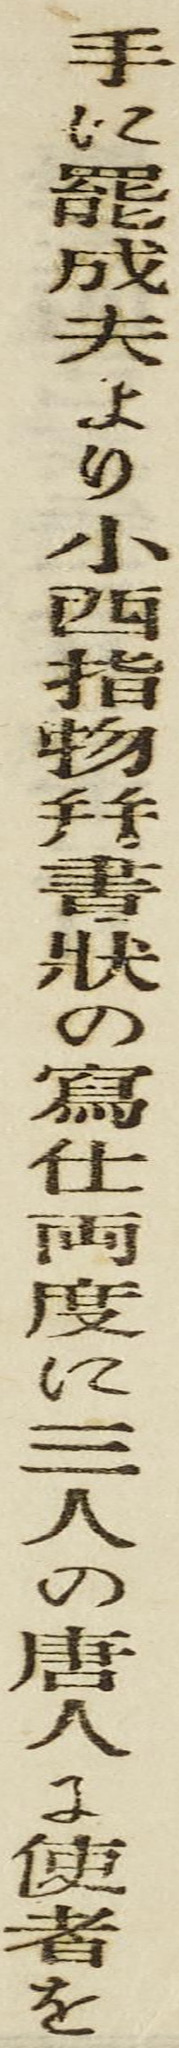手に罷成夫より小西指物幷書状の写仕両度に三人の唐人に使者を
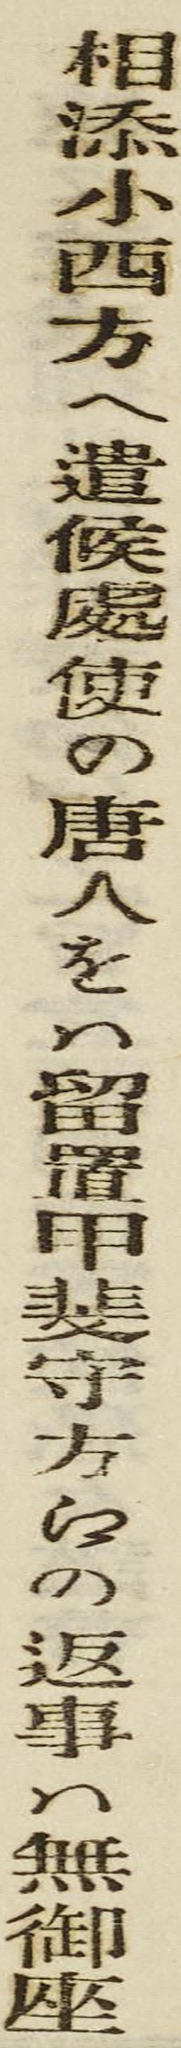相添小西方へ遣候処使の唐人をハ留置甲斐守方えの返事ハ無御座
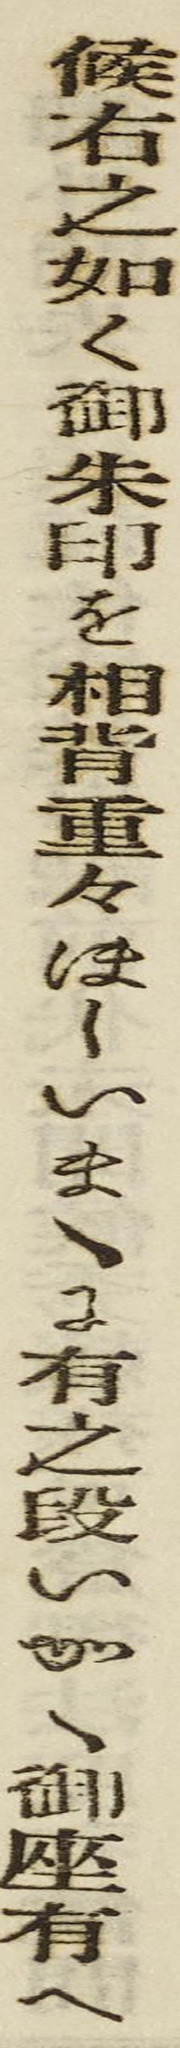候右之如く御朱印を相背重々ほしいまゝに有之段いかゝ御座有へ
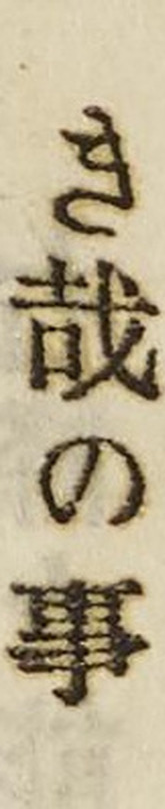き哉の事
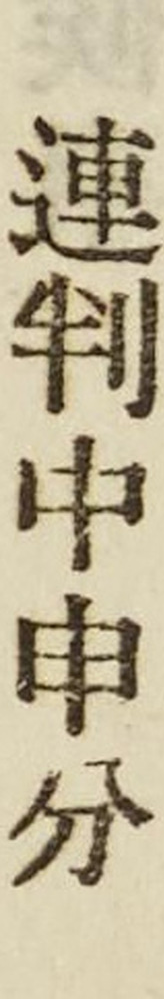連判中申分
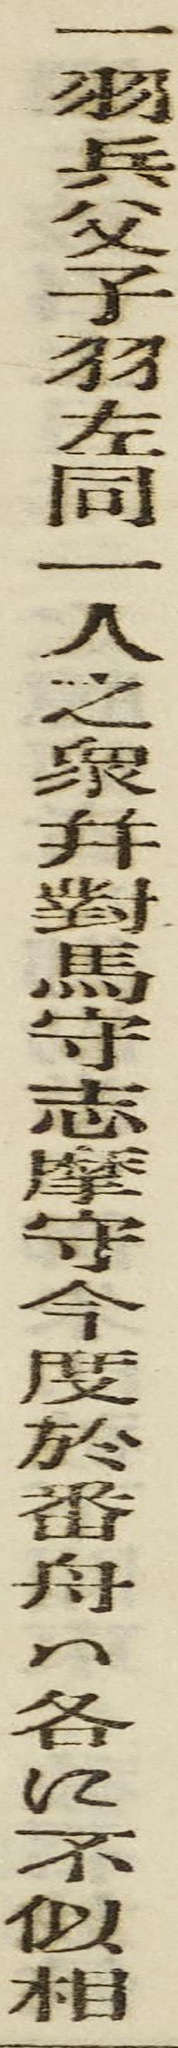一羽兵父子羽左同一人之衆幷対馬守志摩守今度於番舟ハ各に不似相
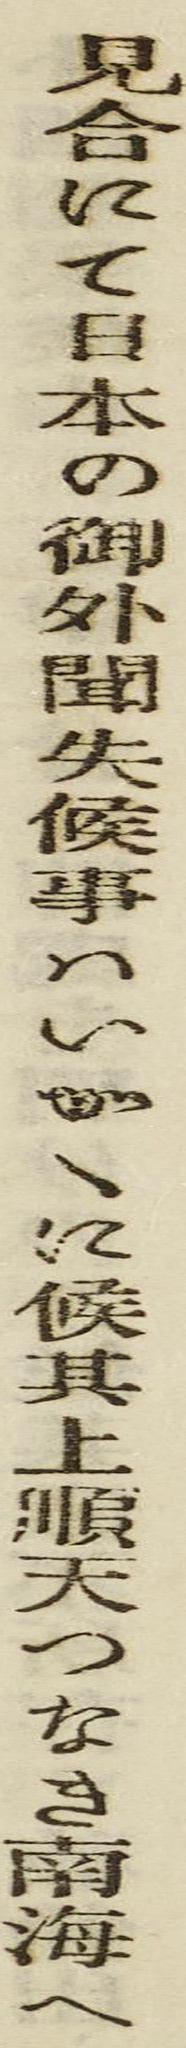見合にて日本の御外聞失候事ハいかゝに候其上順天つなき南海へ
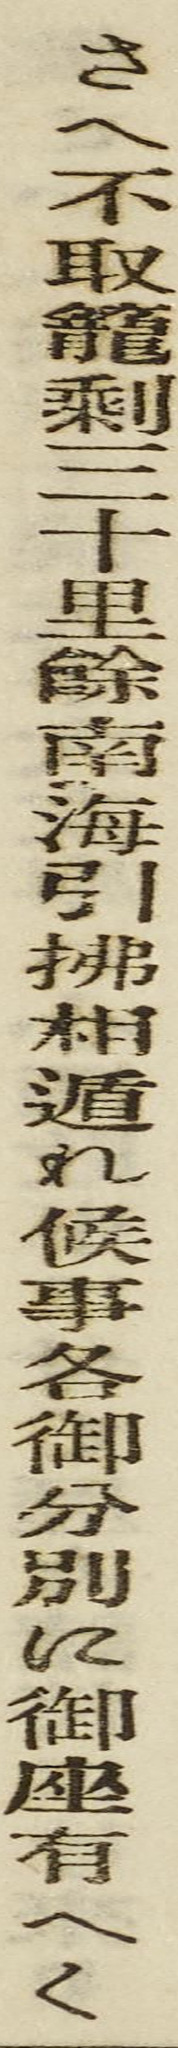さへ不取籠剰三十里余南海引払相遁れ候事各御分別に御座有へく

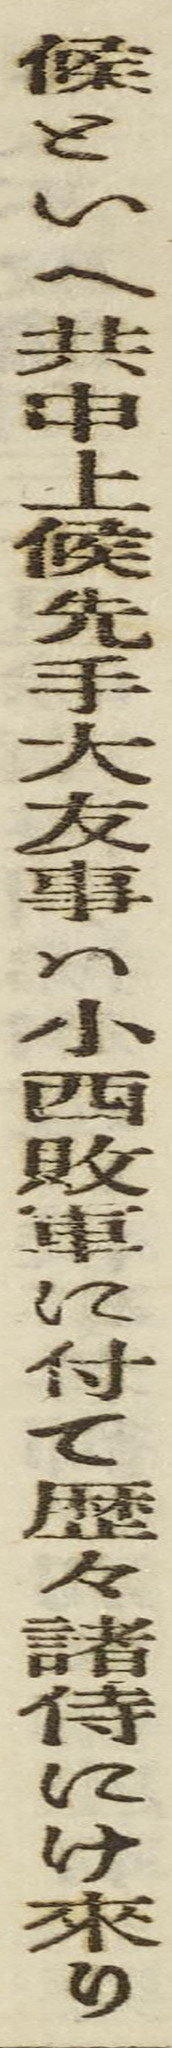候といへ共申上候先手大友事ハ小西敗軍に付て歴々諸侍にけ来り
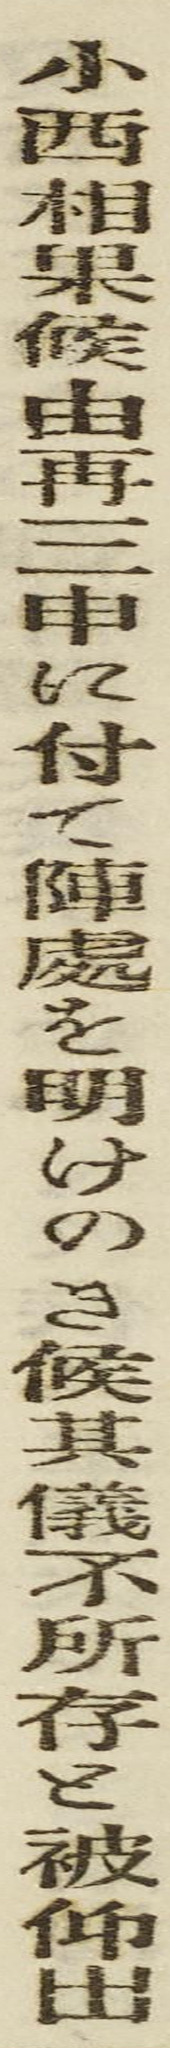小西相果候由再三申に付て陣処を明けのき候其儀不所存と被仰出
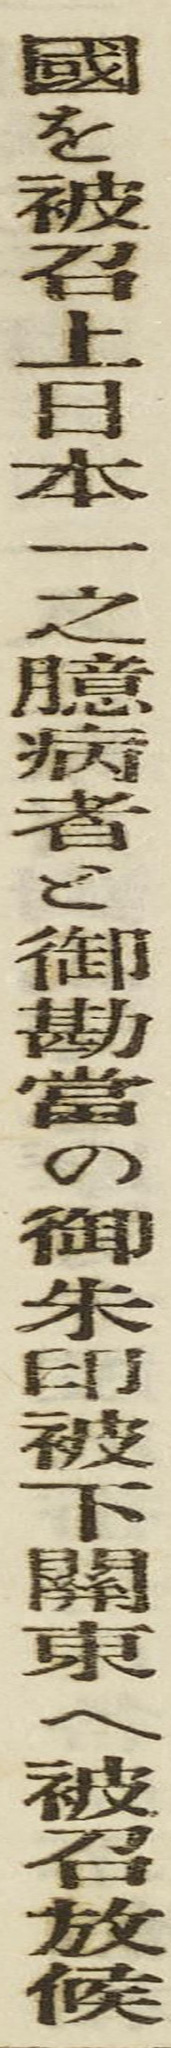国を被召上日本一之臆病者と御勘当の御朱印被下関東へ被召放候
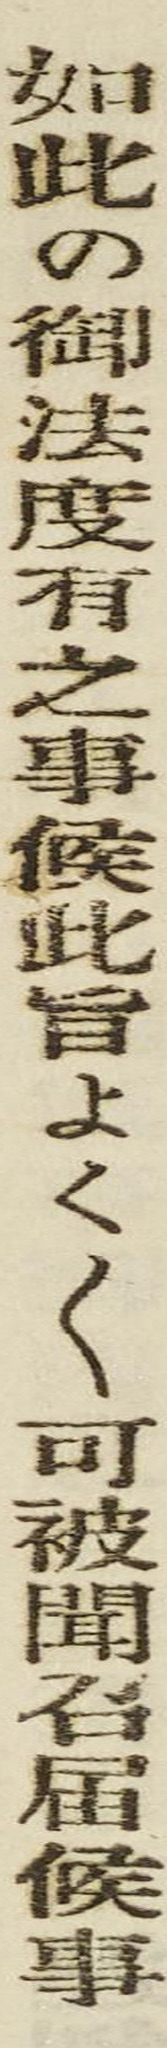如此の御法度有之事候此旨よく〳〵可被聞召届候事
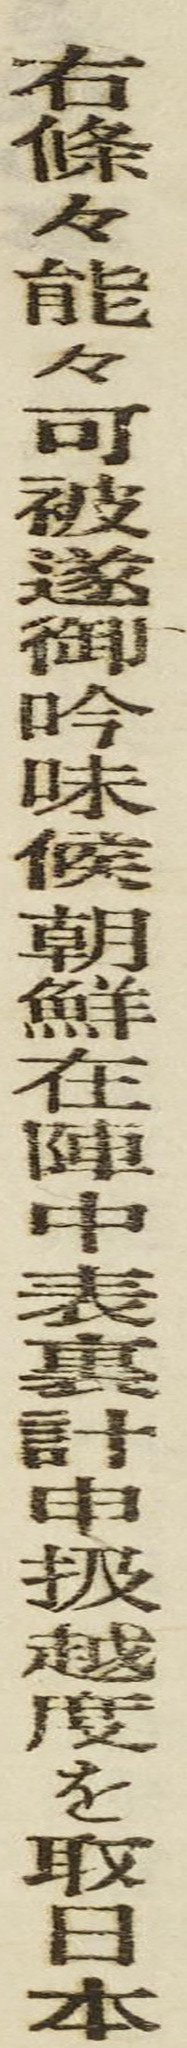右条々能々可被遂御吟味候朝鮮在陣中表裏計申扱越度を取日本
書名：史籍集覽　朝鮮陣古文・細井廣澤記・颶風紀事・天明七年將軍宣下次第書　全
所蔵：東京大学地震研究所図書室 Earthquake Research Institute Library, The University of Tokyo, JAPAN
